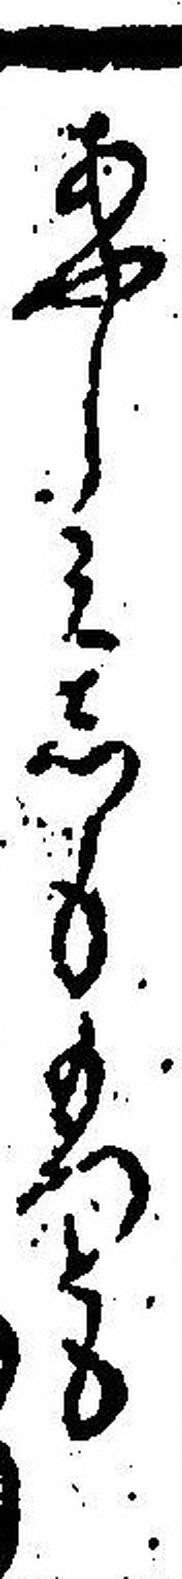あやしみしももつとも
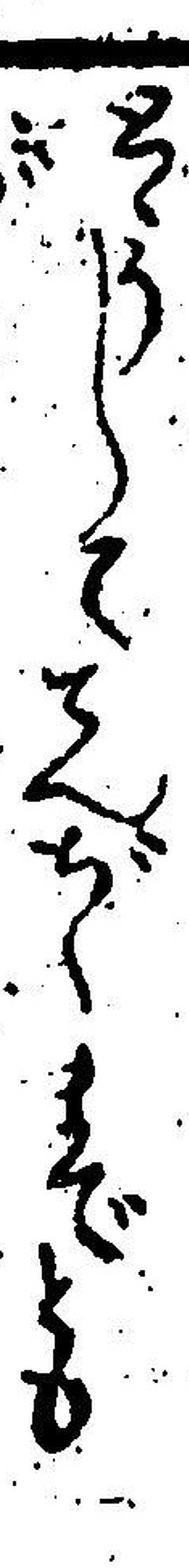とゝうしててんぢくまでとも
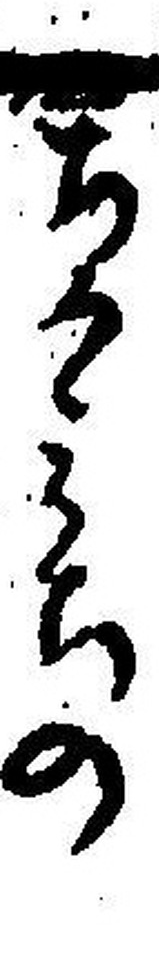ちかみちの
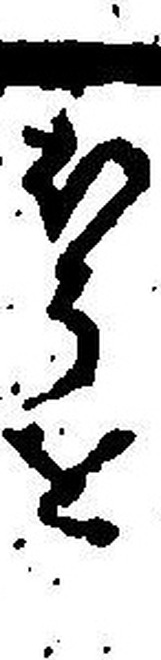ほうを
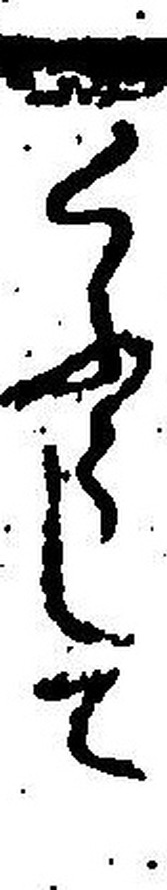くふうして
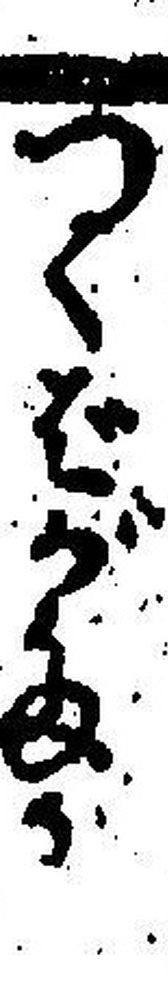つくばがたか
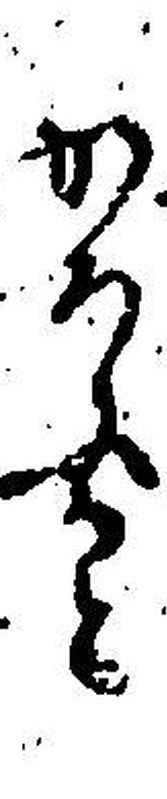かろふかと
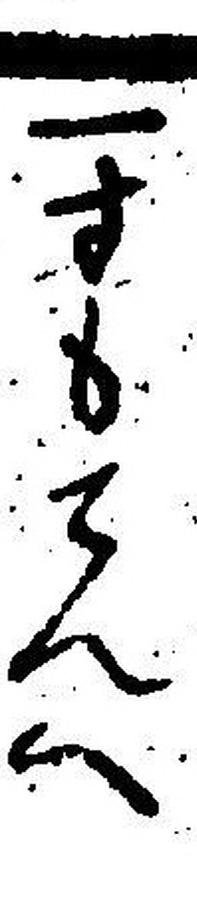一寸もてんへ
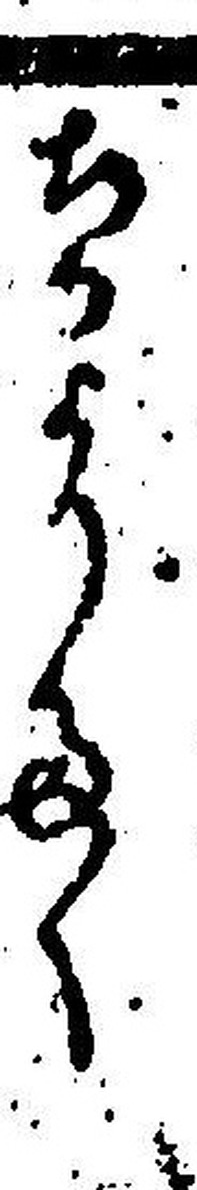ちかよりたく
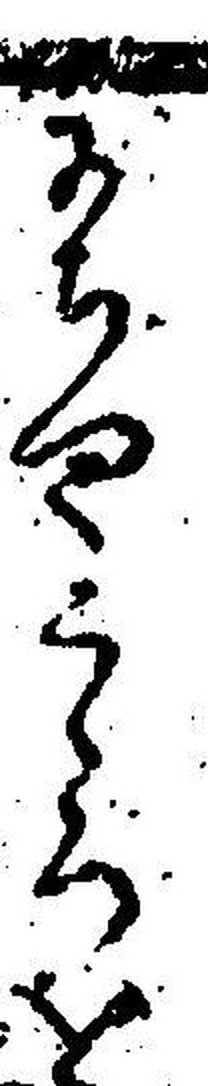にちやこゝろを

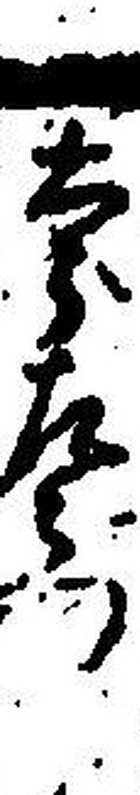太郎左衛門
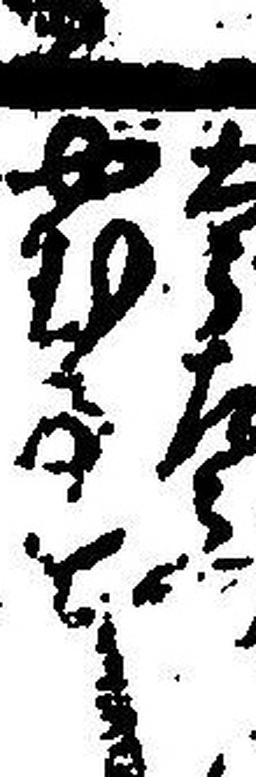やむ事を
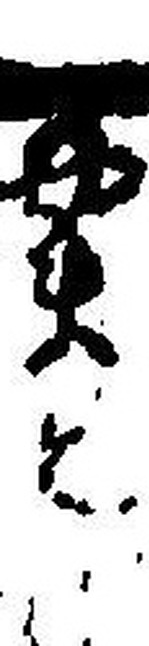やまと
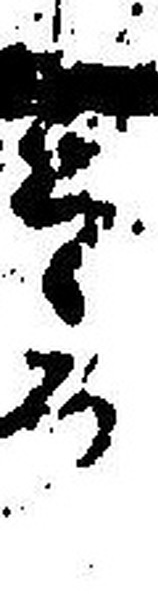こゝろ
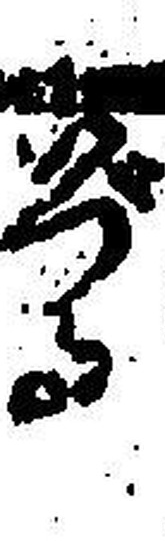いづる
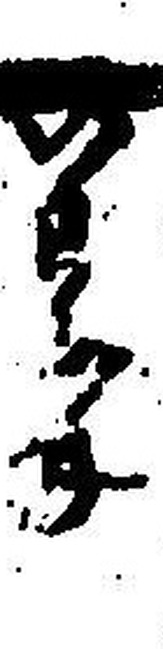いわふね
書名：牡丹餅棚有 / 市場通笑作
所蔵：東京大学総合図書館 General Library in the University of Tokyo, JAPAN
